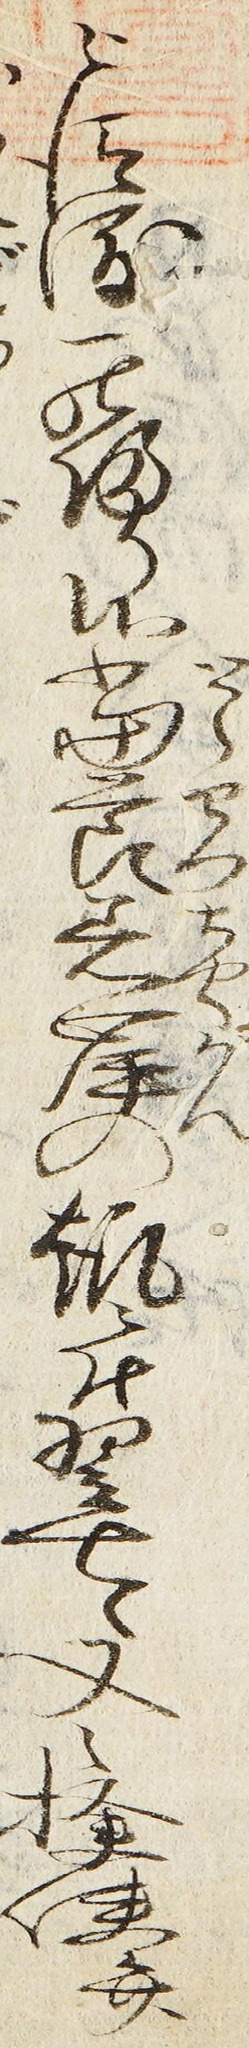被仰渡罷帰り候当節着岸の趣に付翌七日又々検使幷
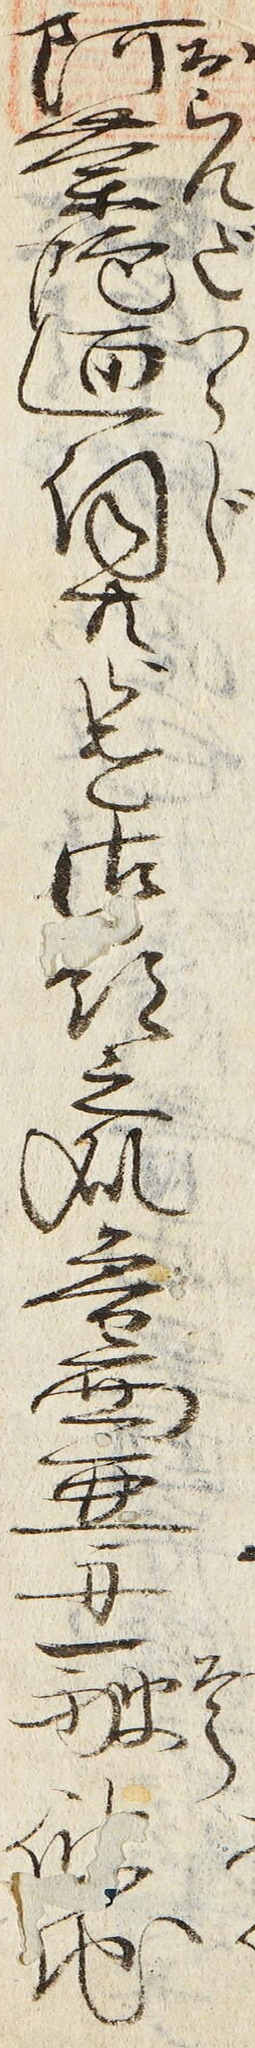阿蘭陀通詞共被遣御尋之処魯西亜舟一艘彼地
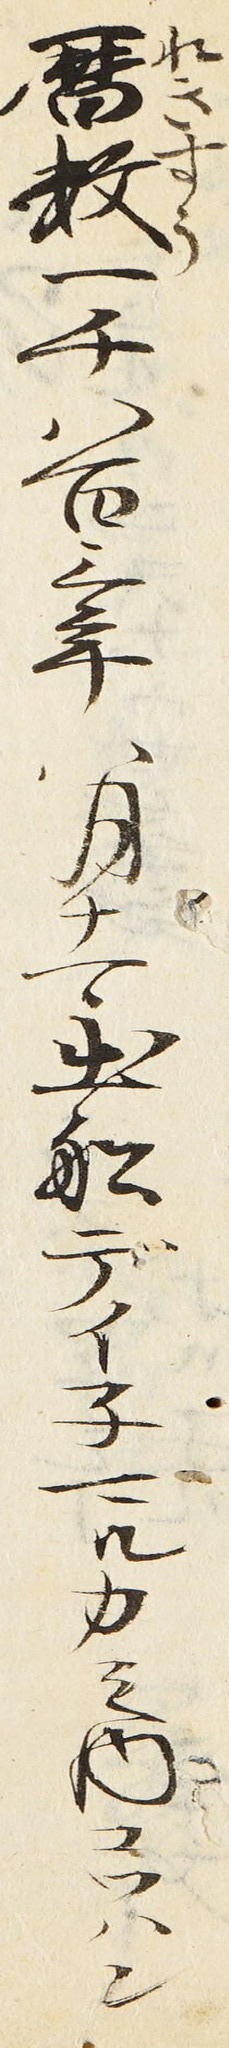暦数一千八百三年八月十一日出舩デイ子マㇽカ之内コツハン
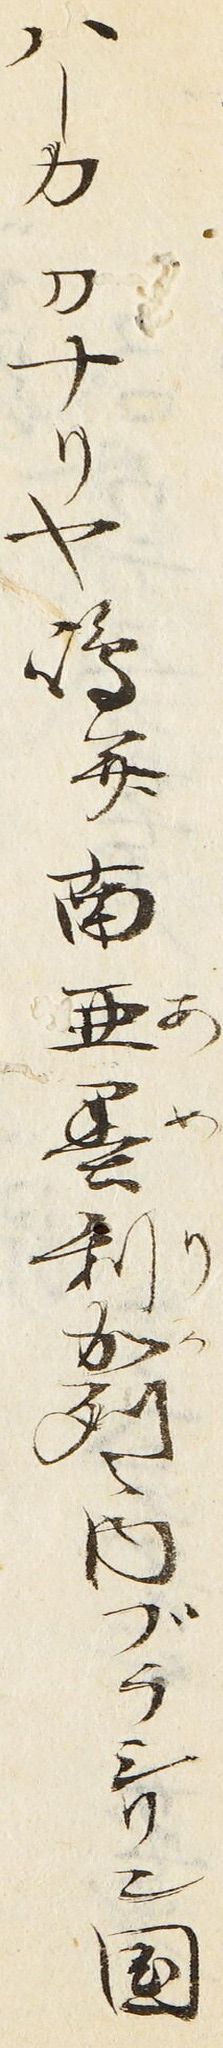ハーカカナリヤ嶋幷南亜墨利加州之内ブラシリン國
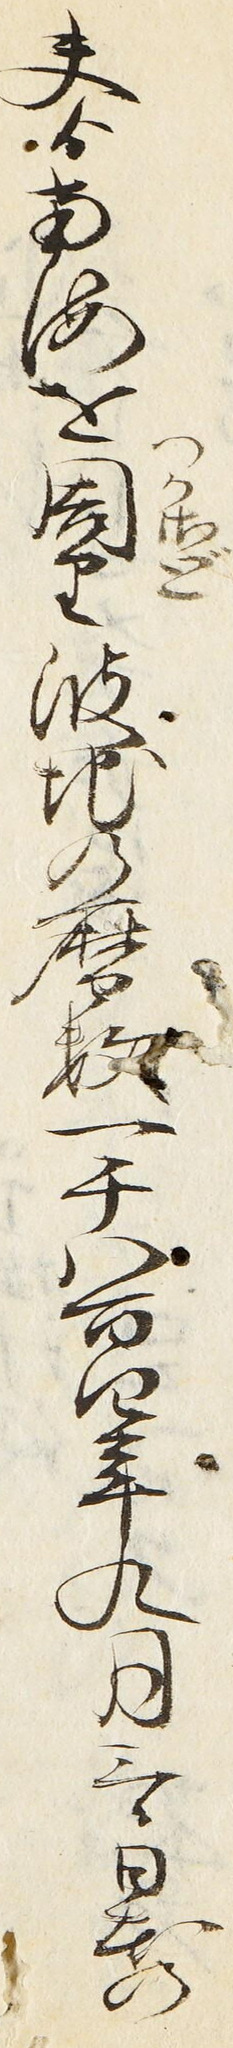夫ゟ当海を周り彼地乃暦数一千八百四年九月三日日本乃
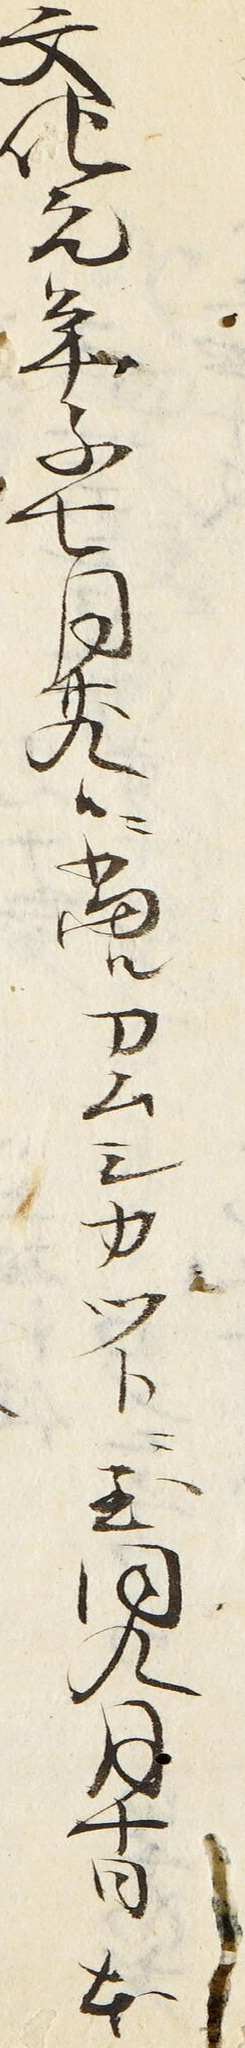文化元年子七月廿九日に当るカムシカツトに至同九月十日本
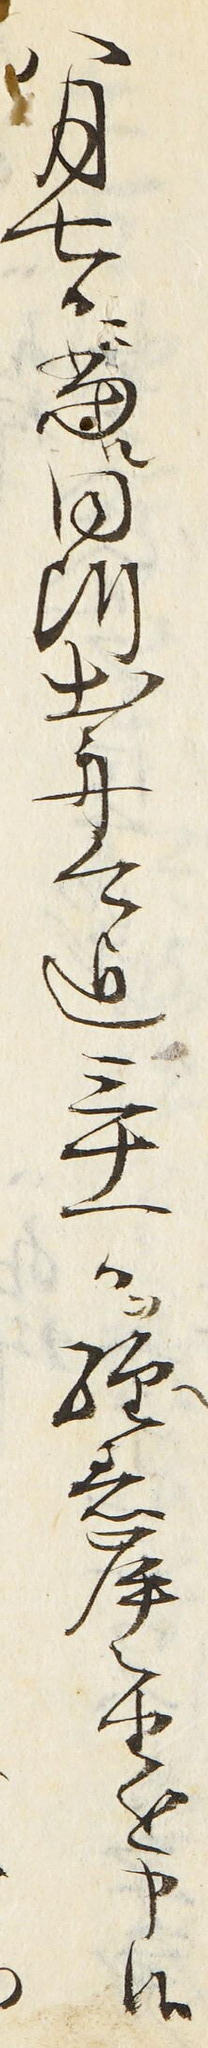八月七日に当る同所出舟今迄三十一かを経着岸乃由を申候
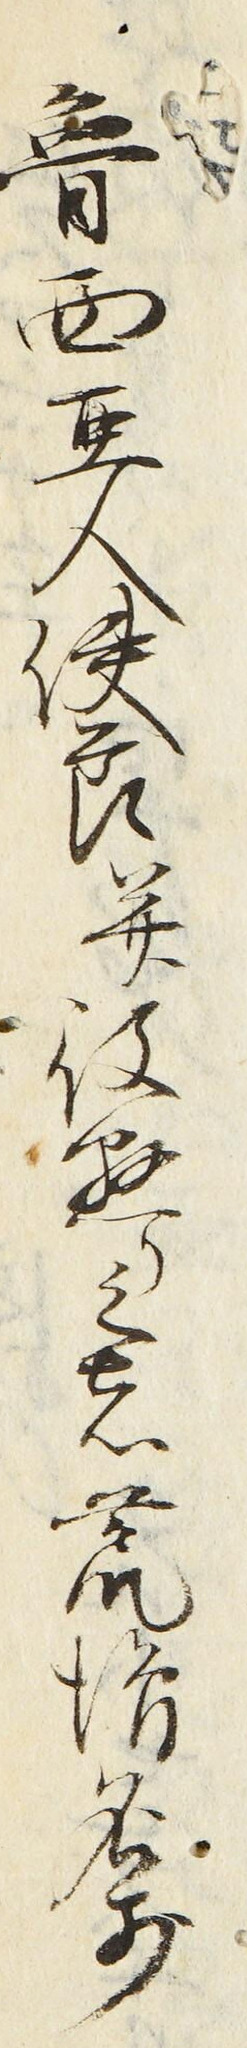魯西亜人使節幷役懸り之者荒増名前

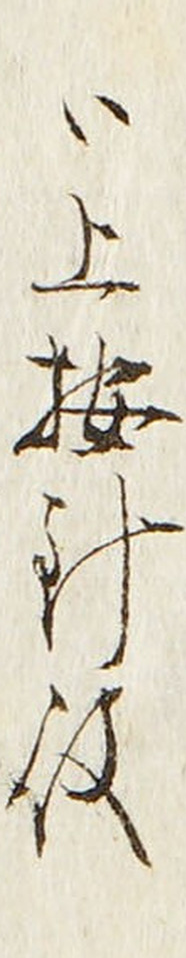〃上按針役
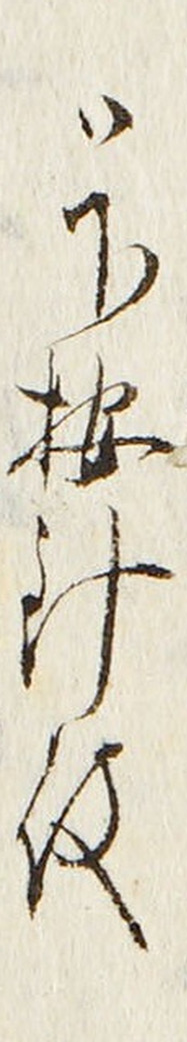〃上按針役
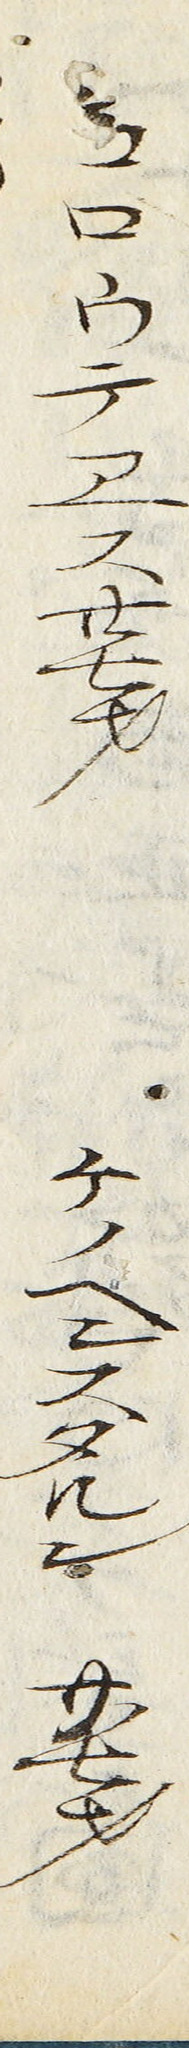コロウテエス廿七才ケノヘンスタルン廿七才
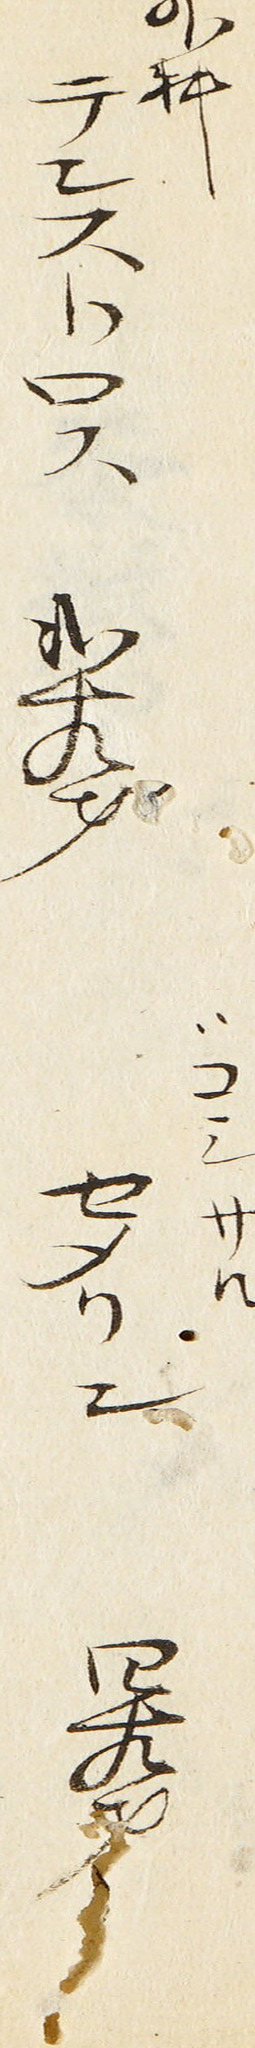テンストロス弐十九才セメリン四十九才
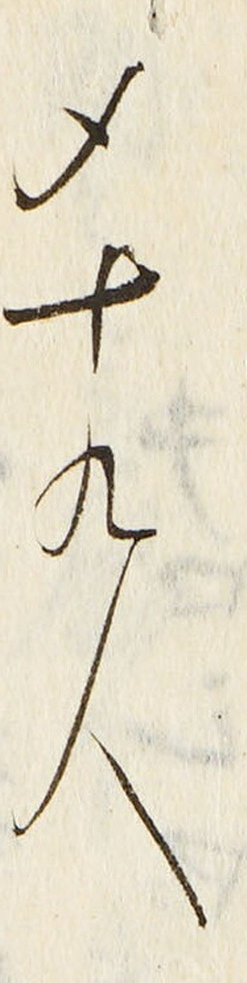〆十九人
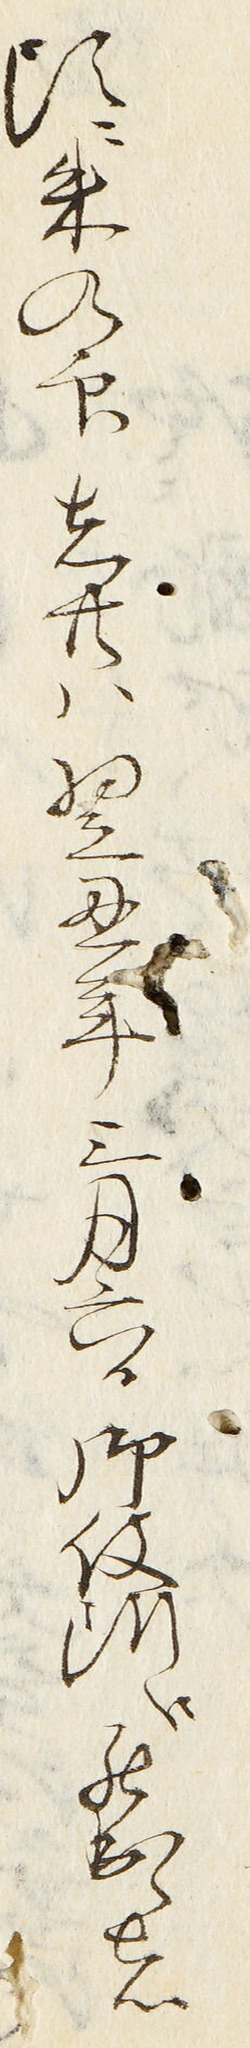頭に朱の印者共は翌丑年三月六日御役所え罷出候者
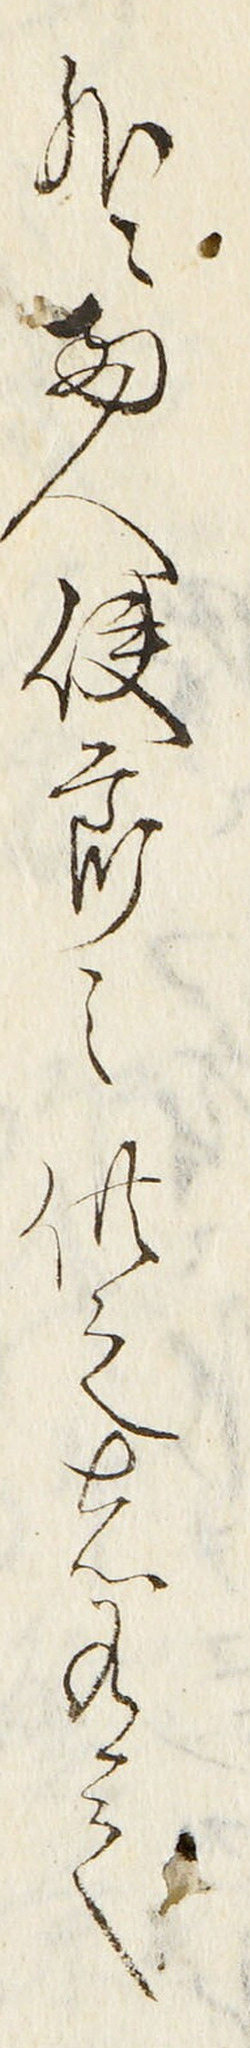外に両人使節之供之者有之
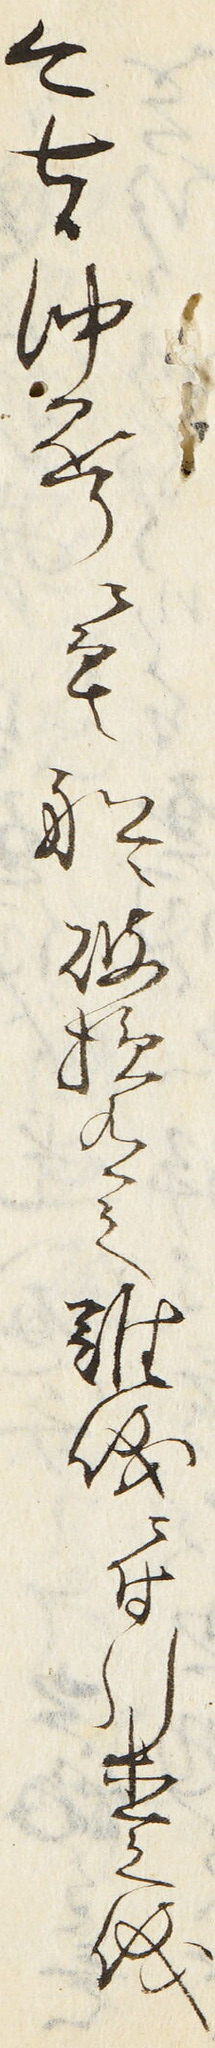今七日沖懸りにては船に破損有之難儀に付引直之儀
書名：魯西亜国舟渡来始末并日本流漂人異国遍歴之話（西洋欧羅巴州之内一）
